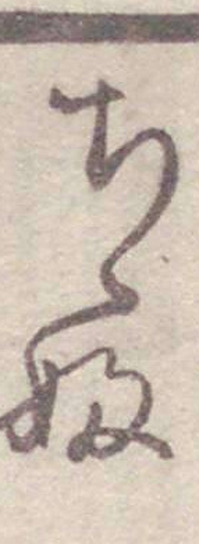ちゝふ
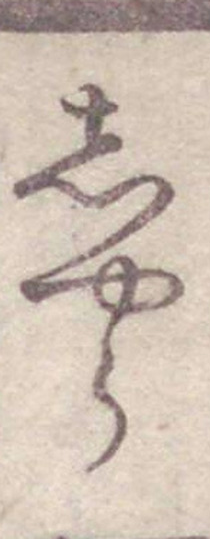しやう
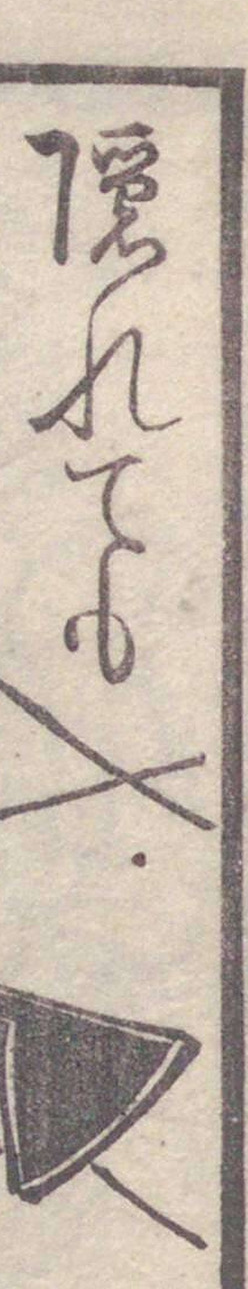隠れても
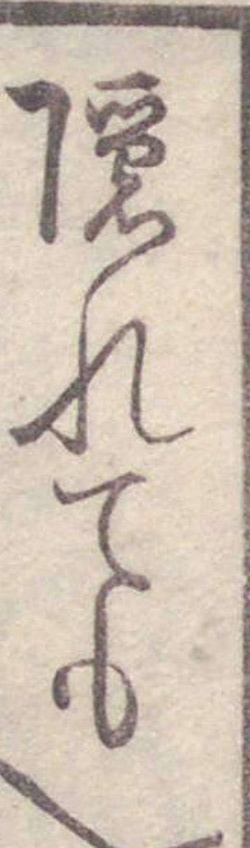隠れても
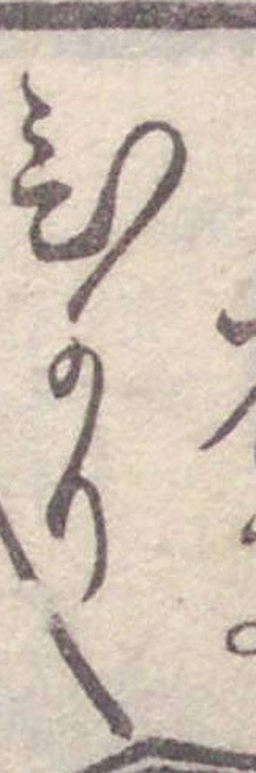ひかり
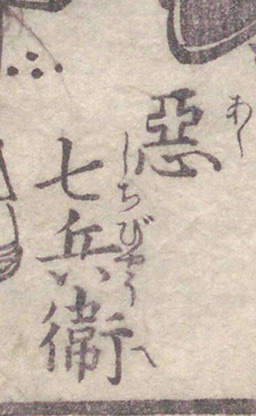七兵衛
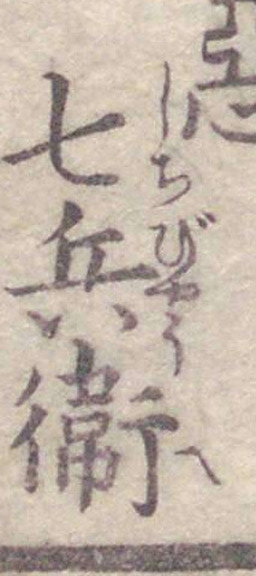七兵衛
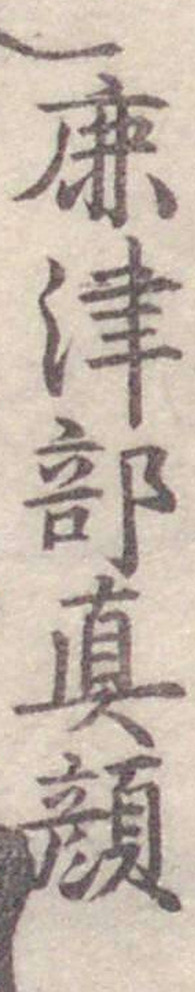鹿津部真顔

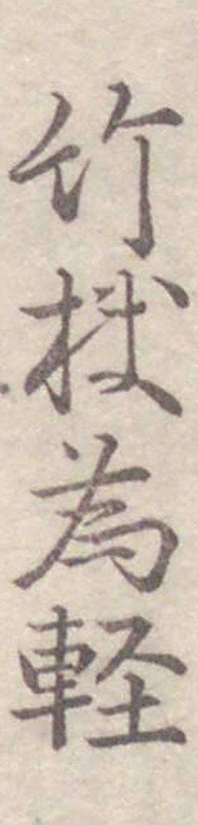竹杖為軽
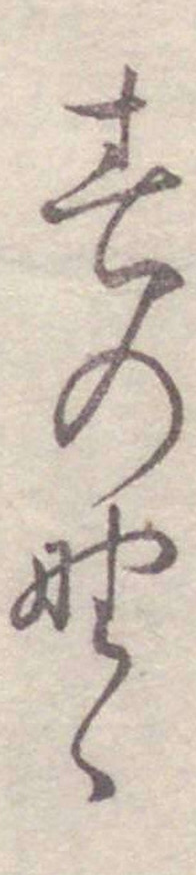春の野ゝ
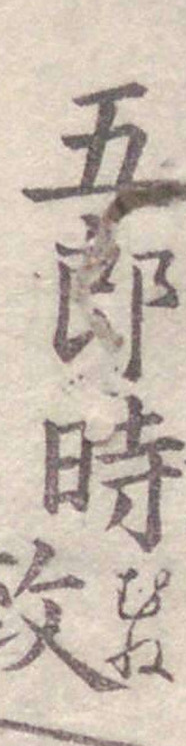五郎時
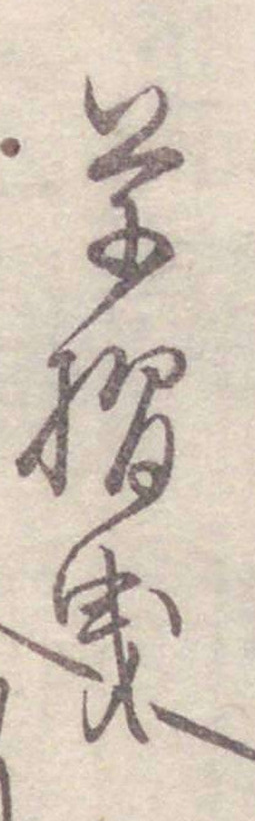草摺曳
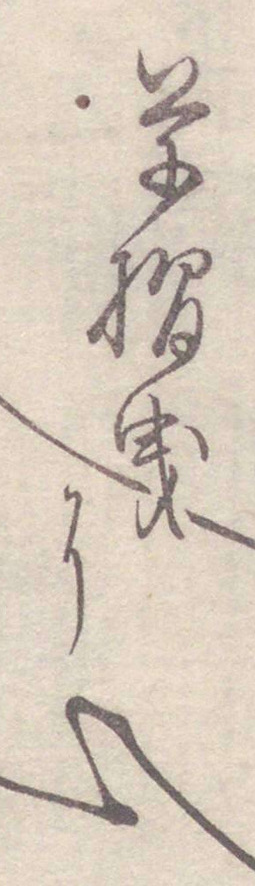草摺曳
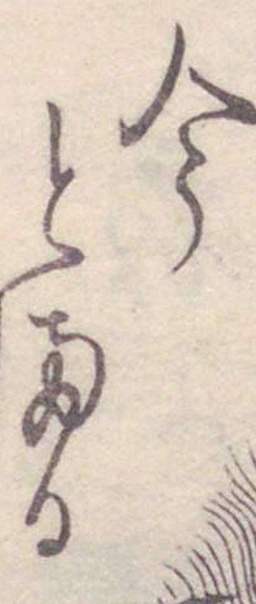とまる
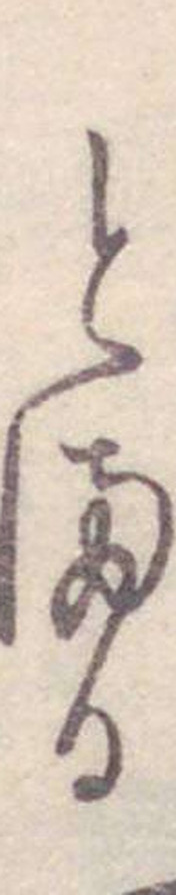とまる
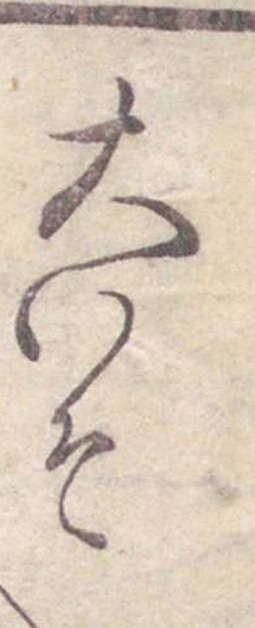大いそ
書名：繪本八十宇治川
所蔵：九州大学中央図書館 国文学研究資料館
